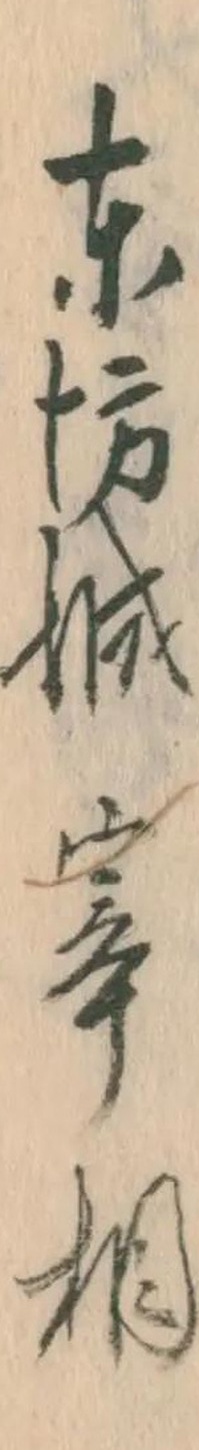東坊城宰相
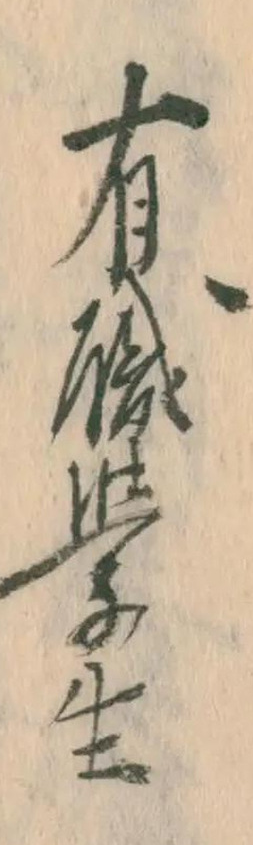有職學生
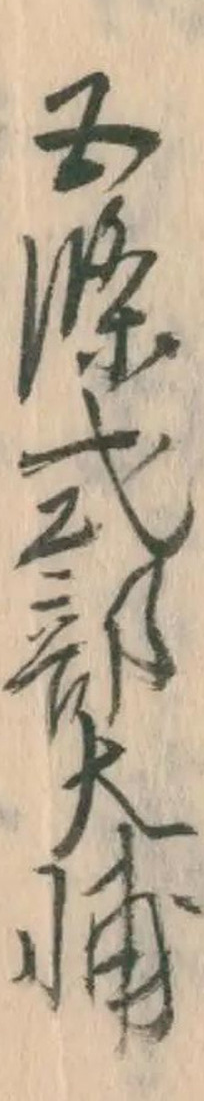五條式部大輔
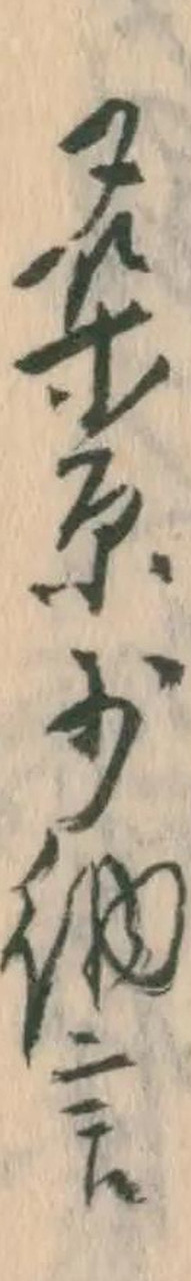桑原少納言
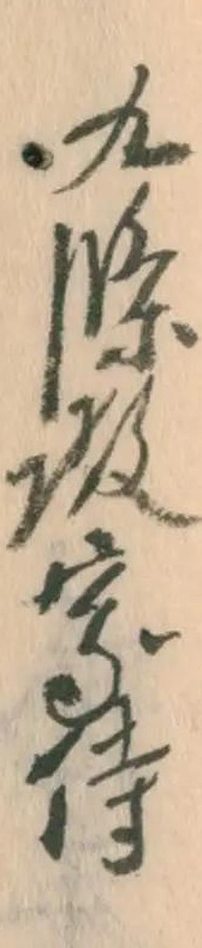九條殿家持
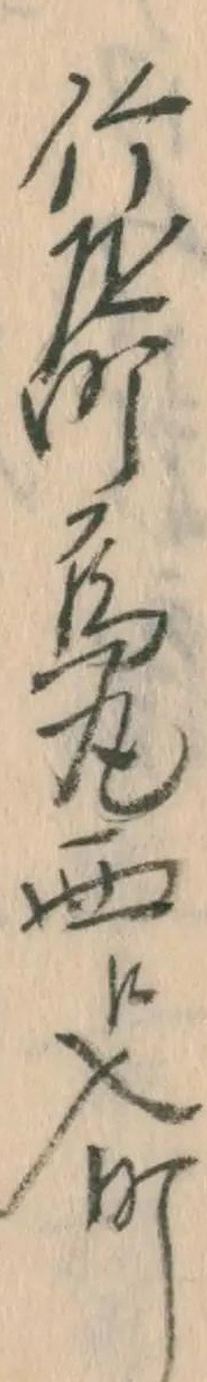竹屋町烏丸西え入町
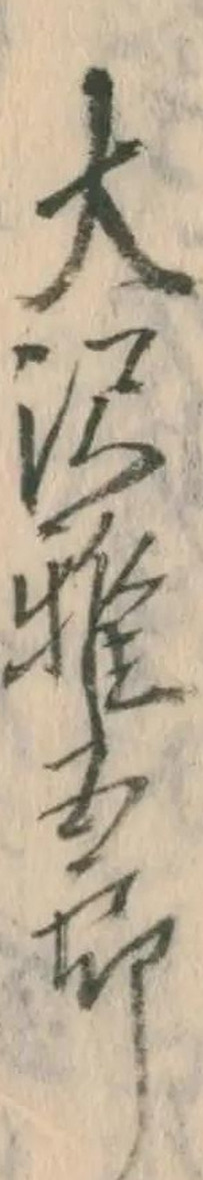大沢雅五郎
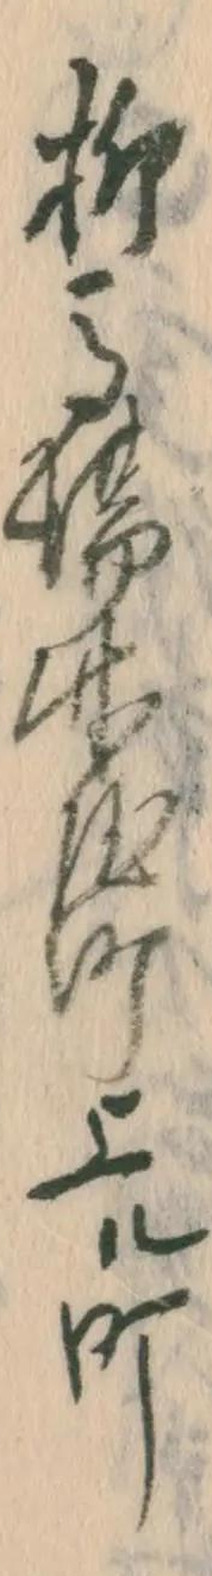柳馬場林屋町上ル町
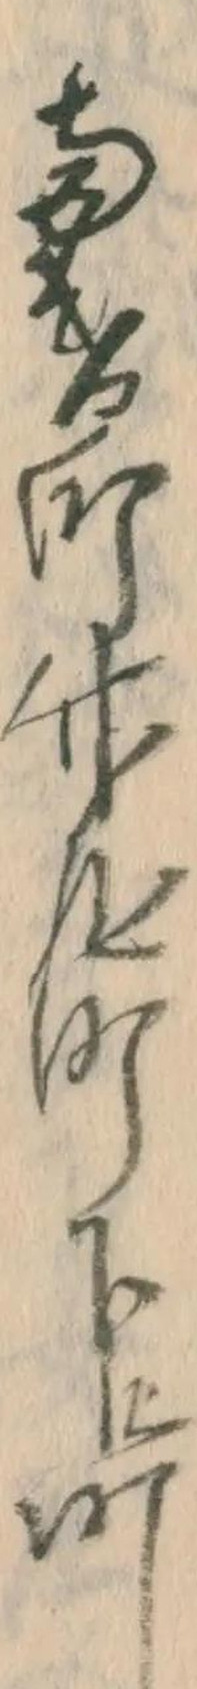両替町竹屋町下ル町
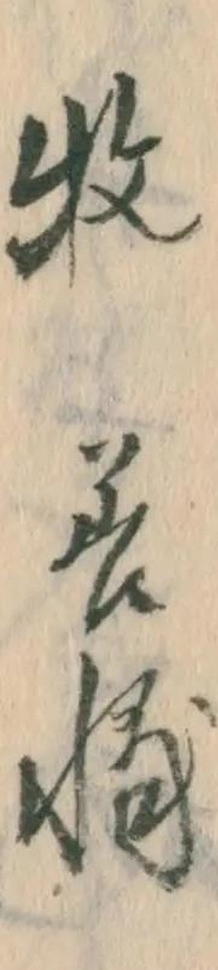牧善輔
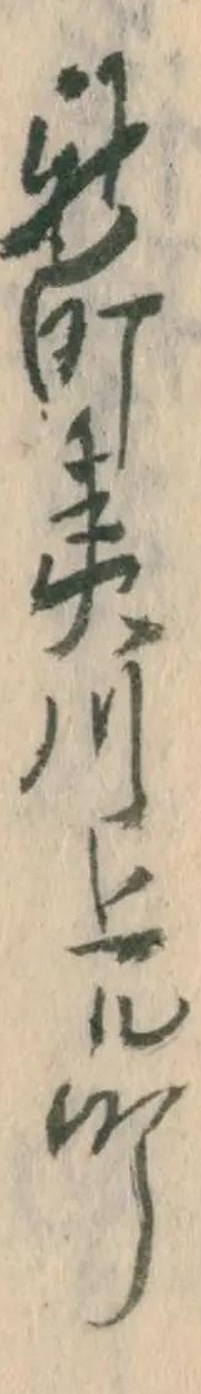新町夷川上ル町
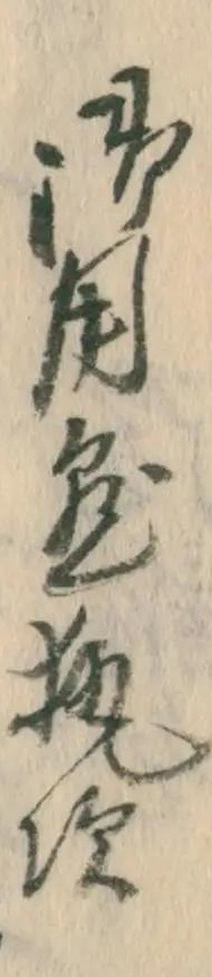御用懸執次
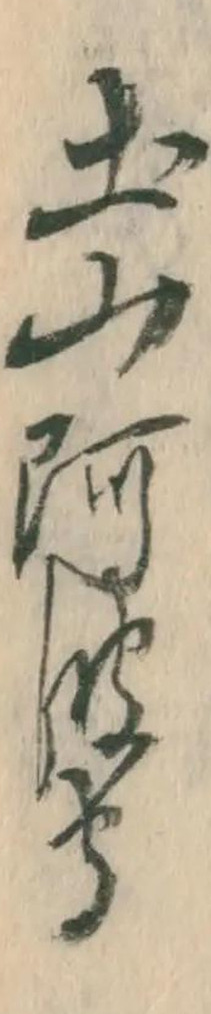土山阿波守

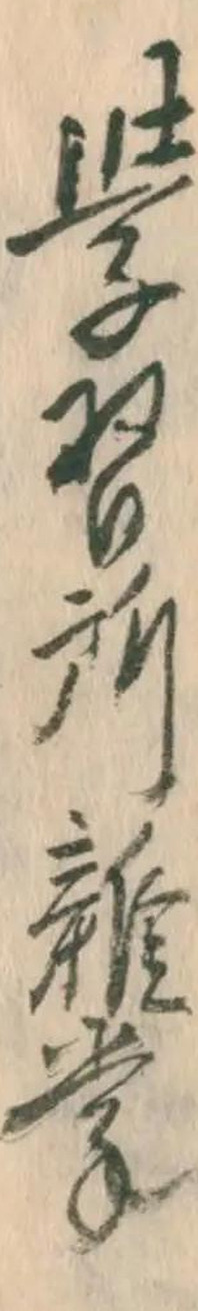學習所雑掌
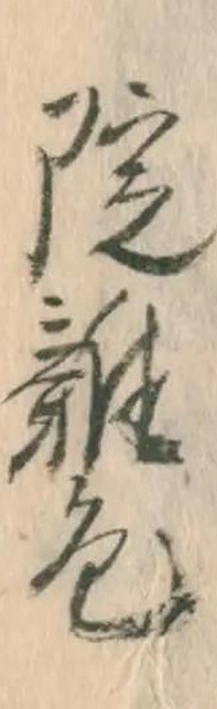院雑色
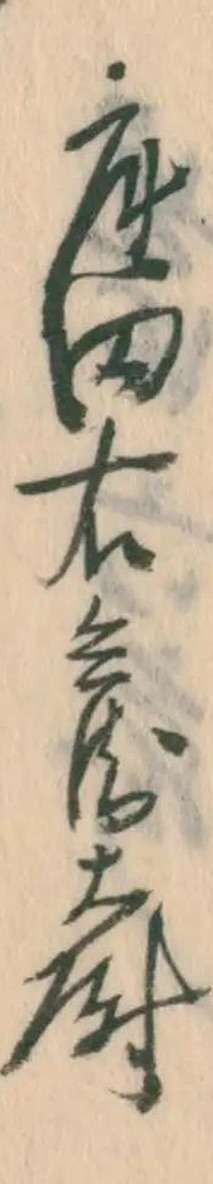座田右兵衛大尉
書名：賀茂社記録. 第70冊
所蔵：国立国会図書館 National Diet Library, JAPAN
